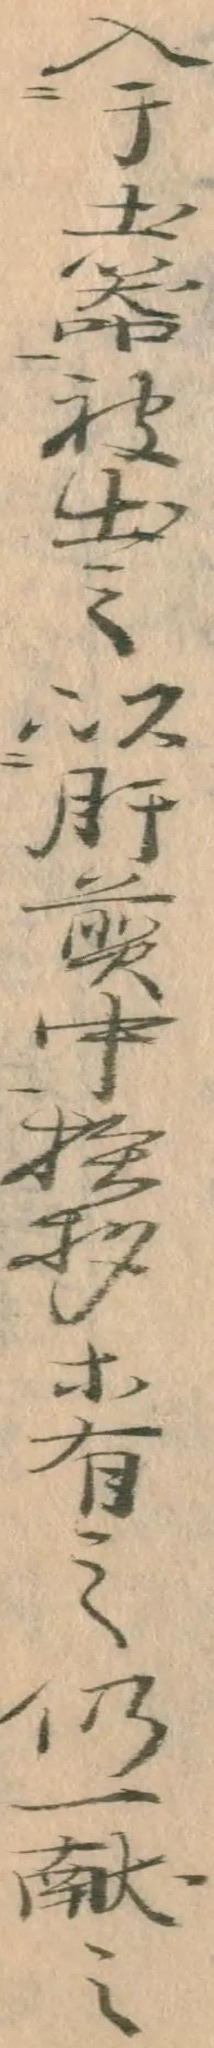入于土器被出之次肝煎中挨拶等有之仍一献之
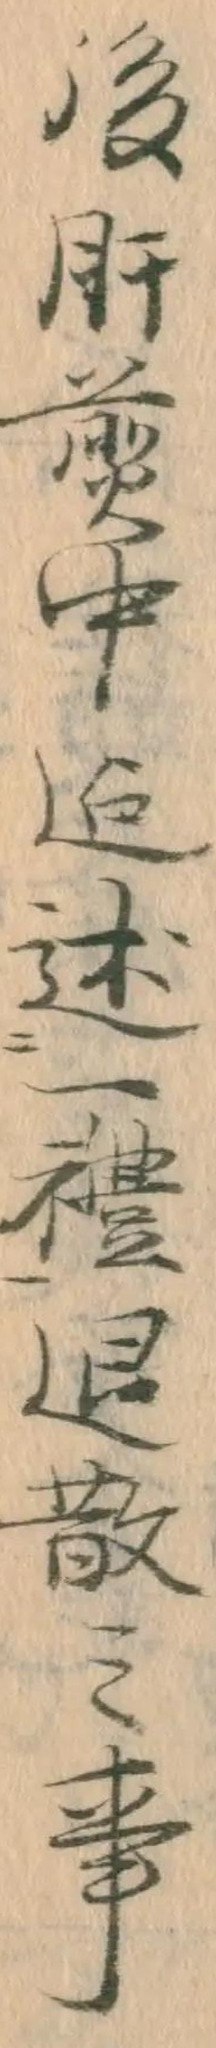後肝煎中迄述一禮退散之事
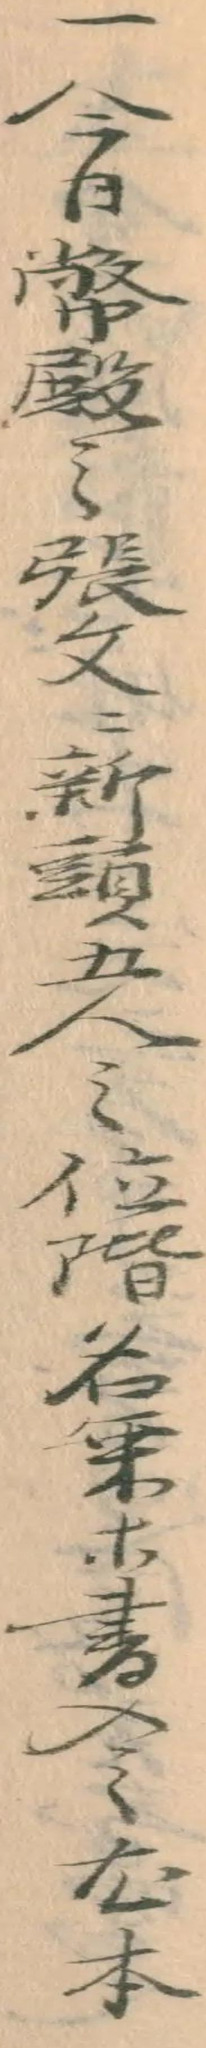一今日幣殿之張文ニ新頭五人之位階名乗等書入之尤本
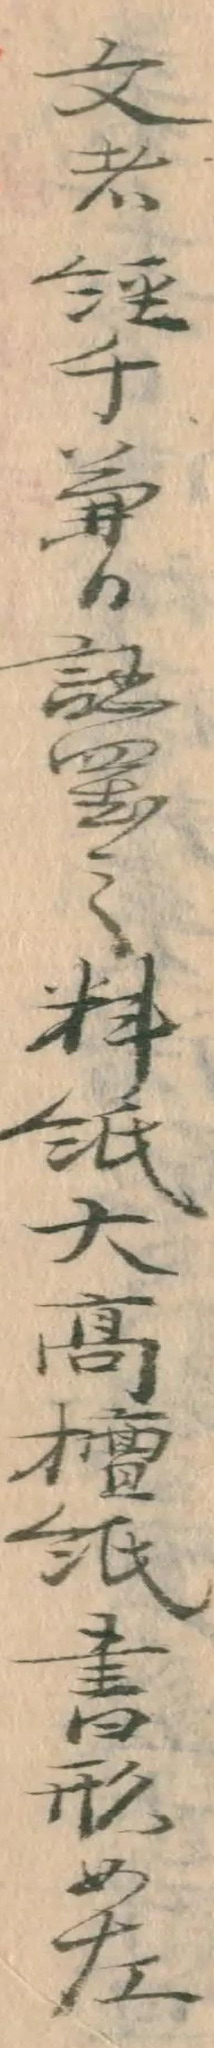文者経千兼日認置也料紙大高壇紙書形如左
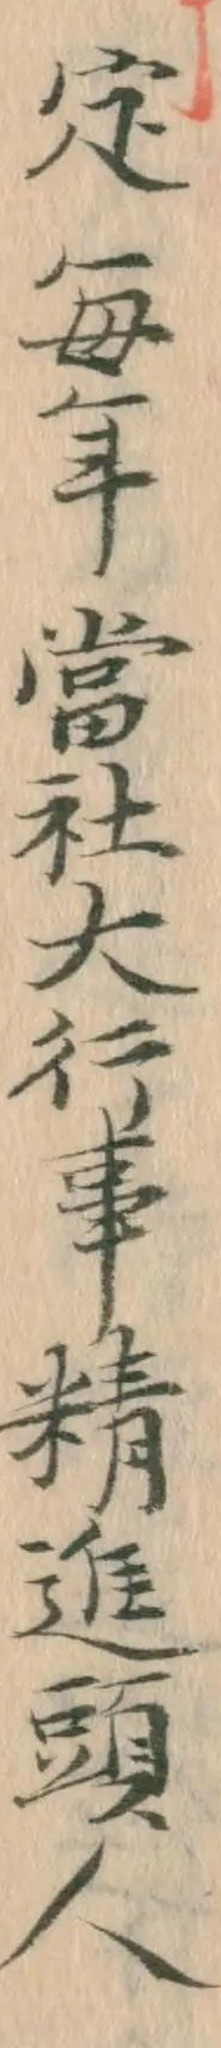定毎年當社大行事精進頭人
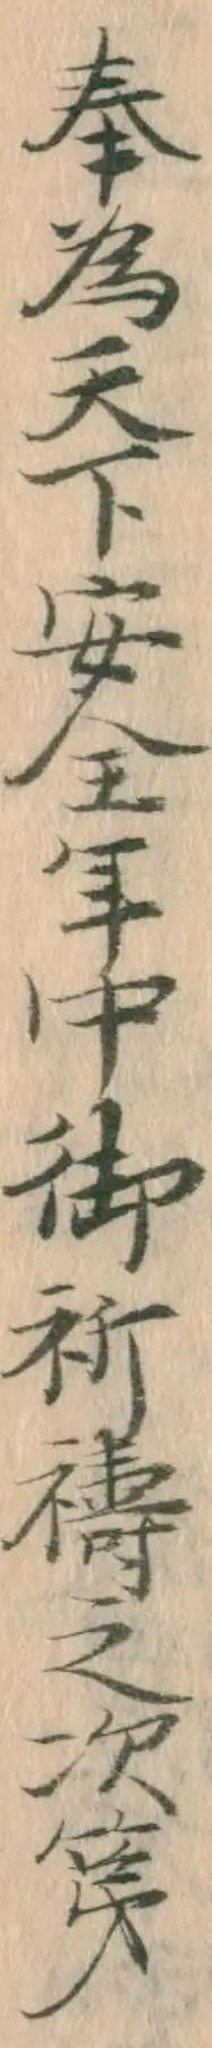奉為天下安全年中御祈祷之次第
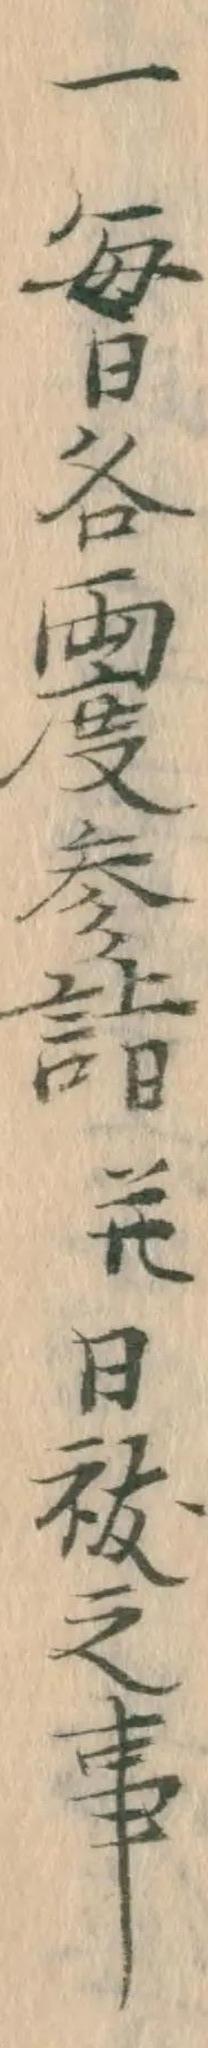一毎日各両度参詣并日祓之事
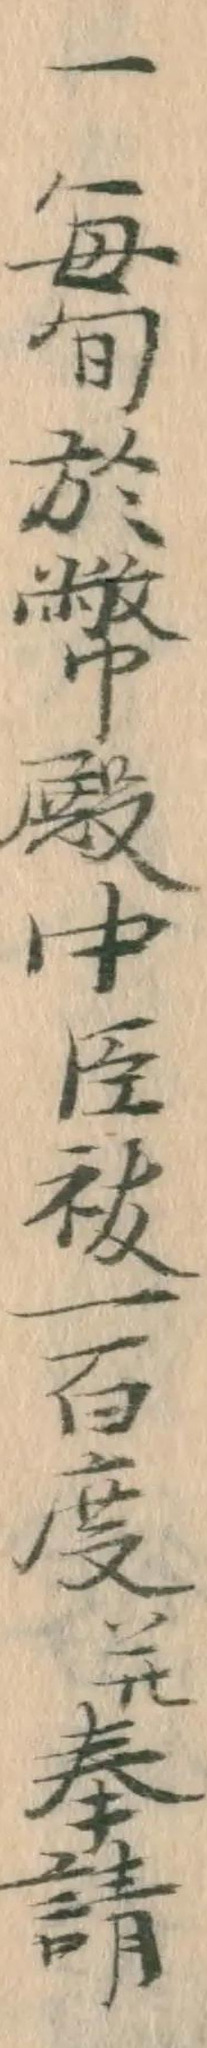一毎旬於幣殿中臣被一百度并奉請
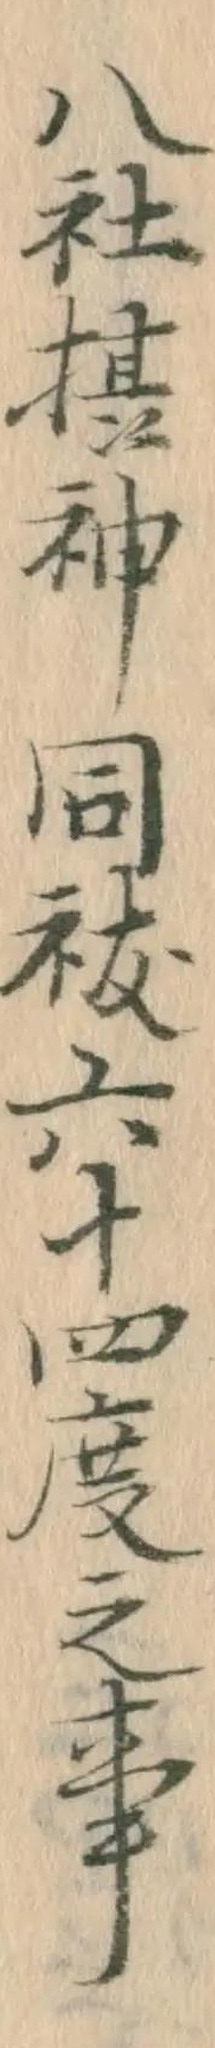八社摂神同祓六十四度之事
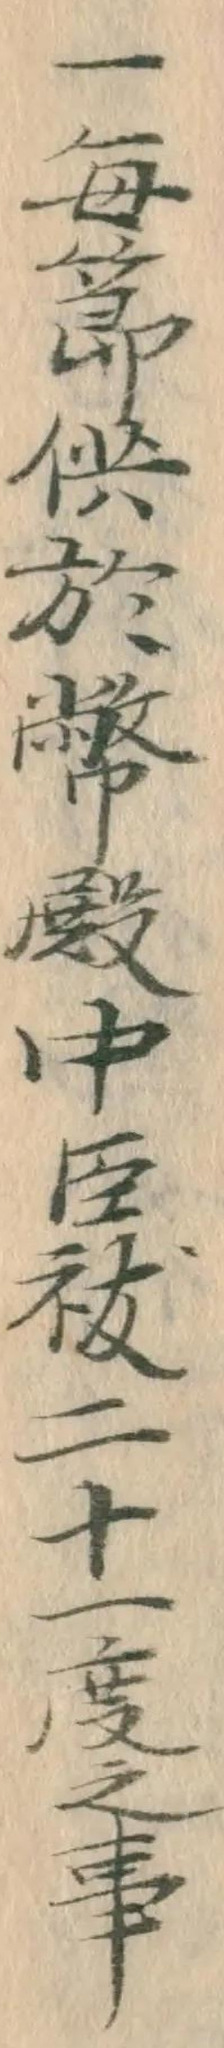一毎節供於幣殿中臣被二十一度之事
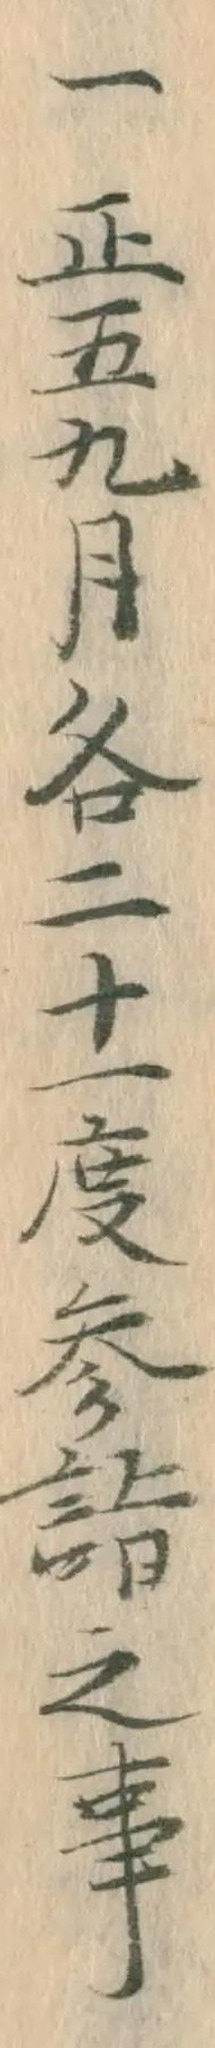一正五月各二十一度参詣之事
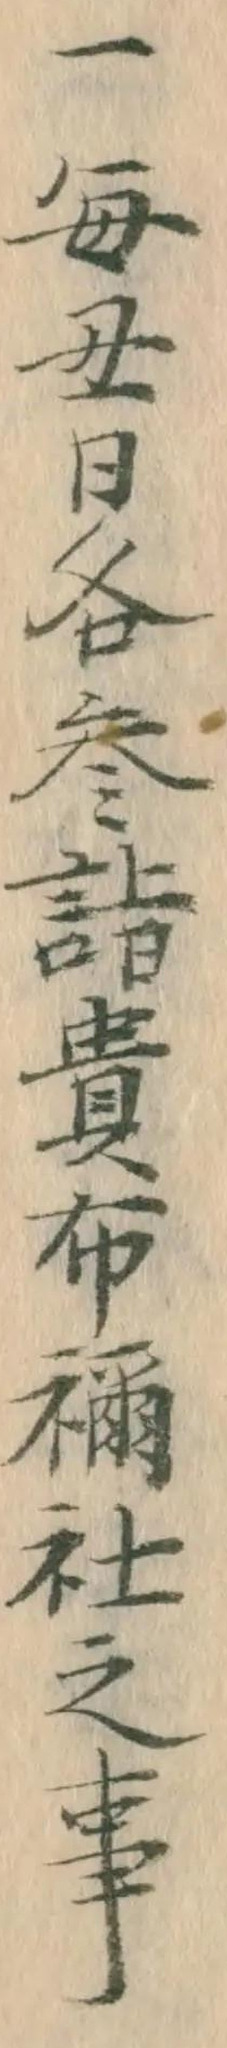一毎丑日各参詣貴布禰社之事

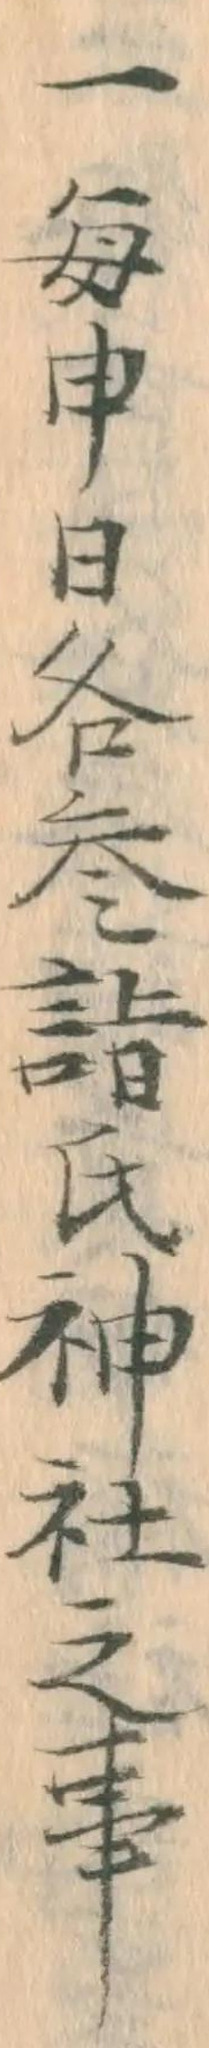一毎申日各参詣氏神社之事
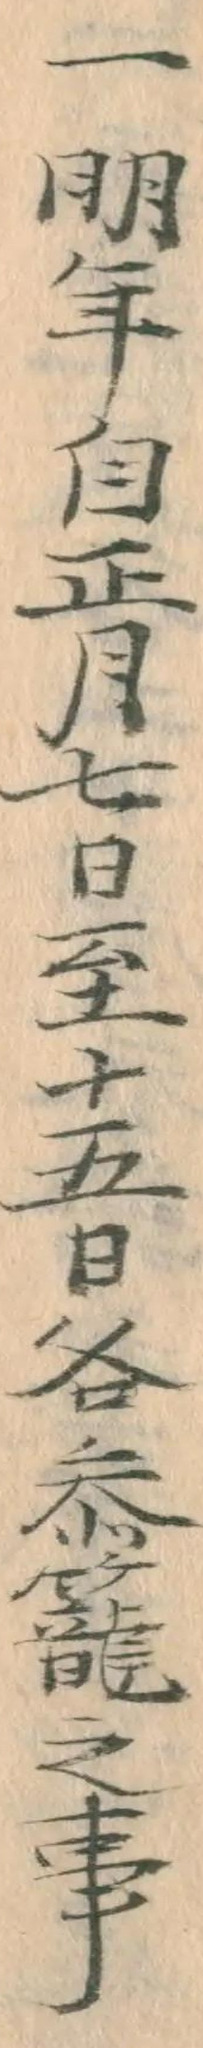一明年自正月七日至十五日各参籠之事
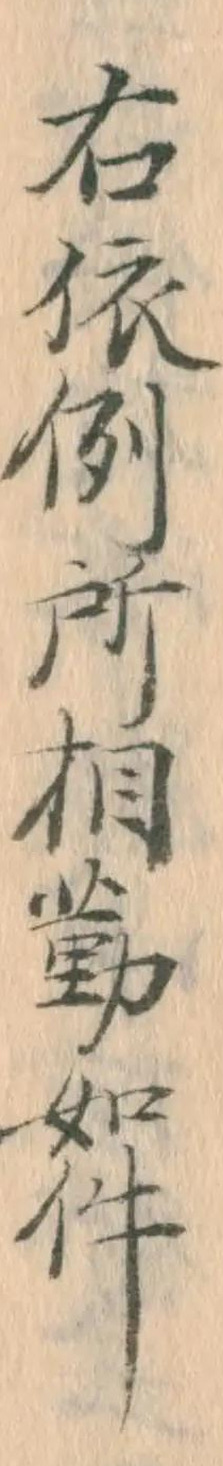右依例所相勤如件
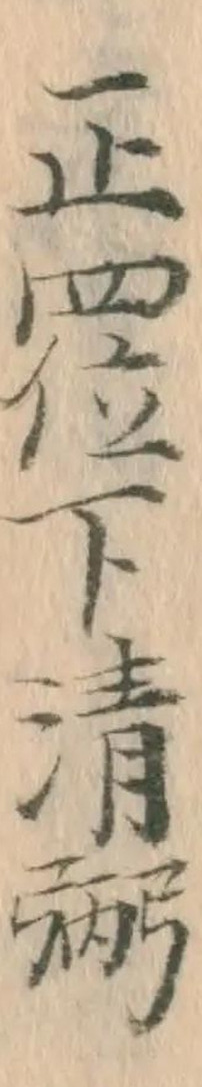正四位下清弼
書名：賀茂社記録. 第72冊
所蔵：国立国会図書館 National Diet Library, JAPAN
